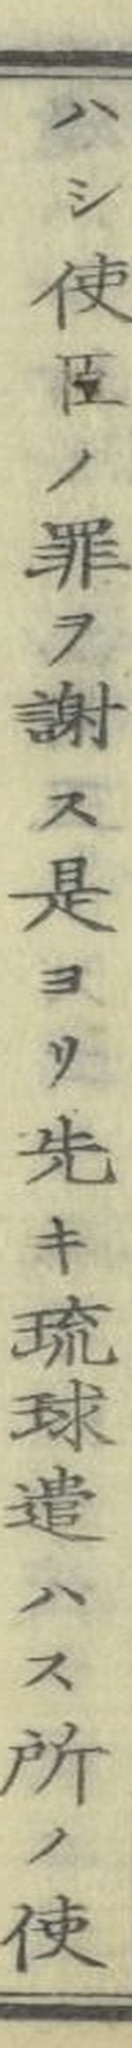ハシ使臣ノ罪ヲ謝ス是ヨリ先キ琉球遣ハス所ノ使
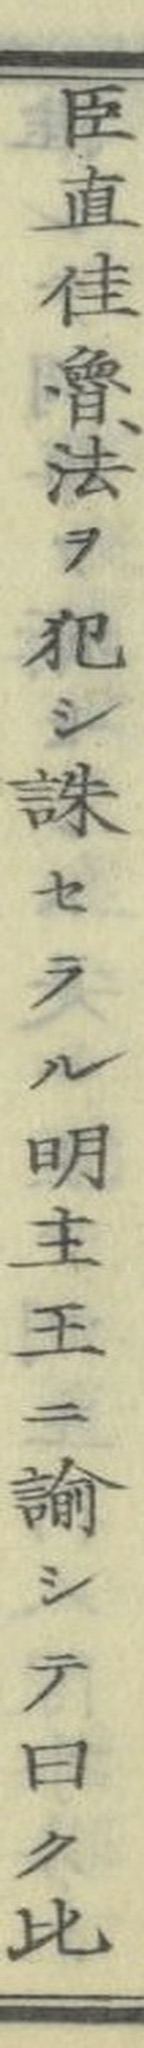臣直佳魯、法ヲ犯シ誅セラル明主王ニ論シテ曰ク比
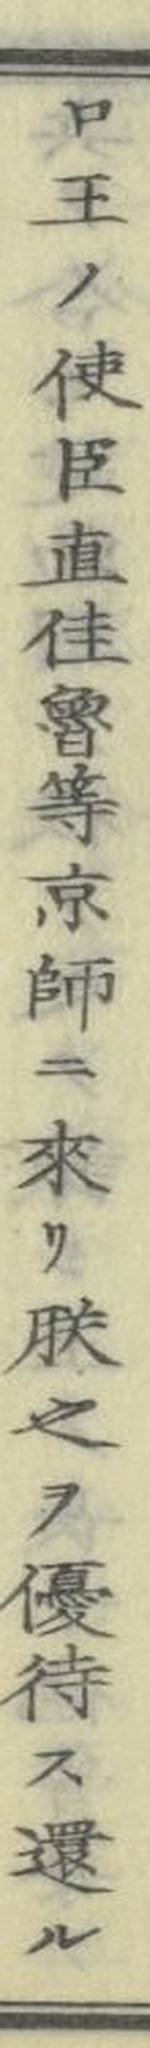ロ王ノ使臣直佳魯等京師ニ來リ联之ヲ優待ス還ル
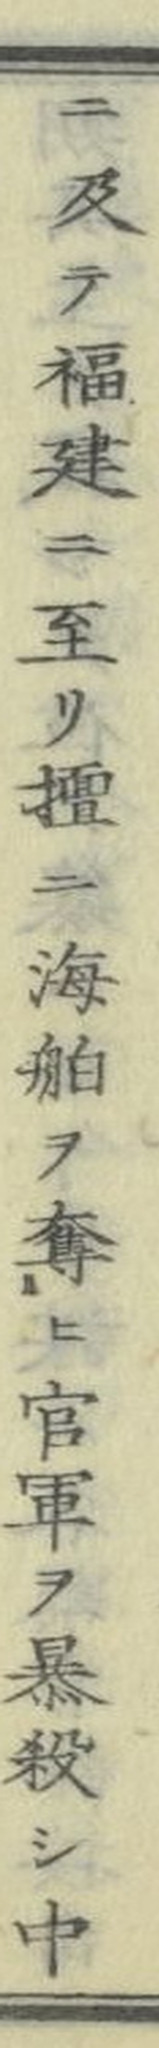ニ及テ福建ニ至リニ海舶ヲ奪ヒ官軍ヲ暴殺シ中
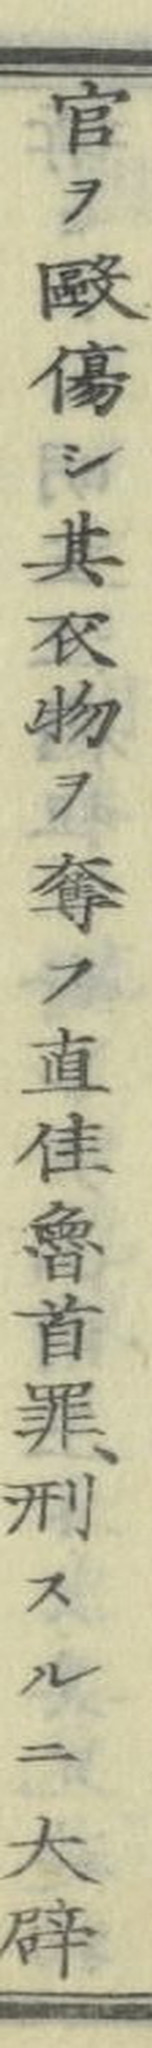官ヲヲ毆傷シ其衣物ヲ奪フ直佳魯首罪、刑スルニ大辟
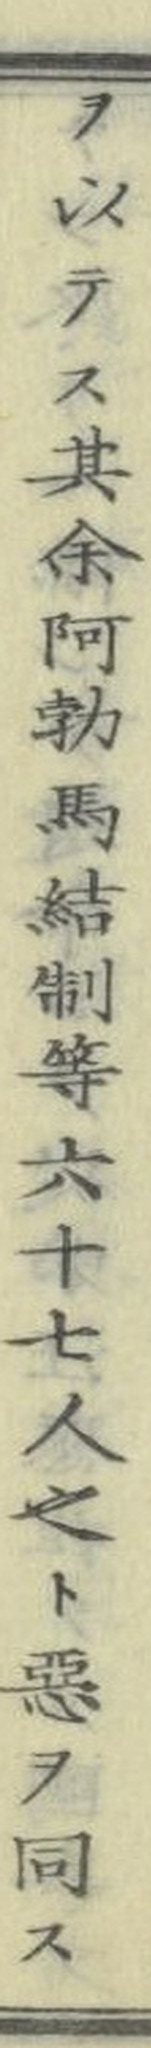ヲ以テス其余阿勃馬結制等六十七人之ト惡ヲ同ス
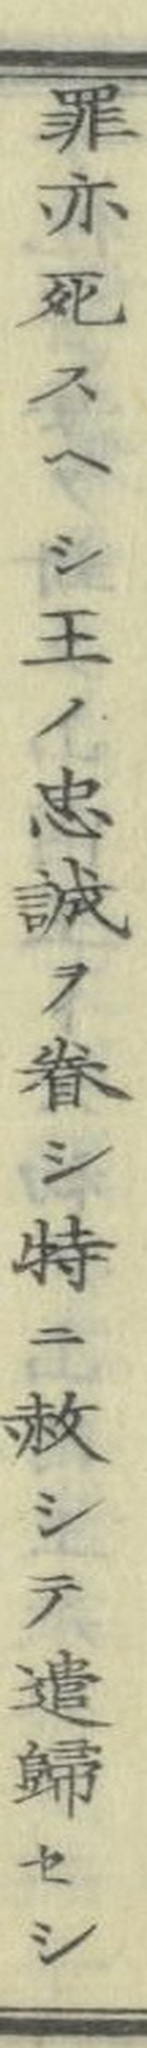罪亦死スヘシ王ノ忠誠ヲ眷シ特ニ赦シテ遣歸セシ
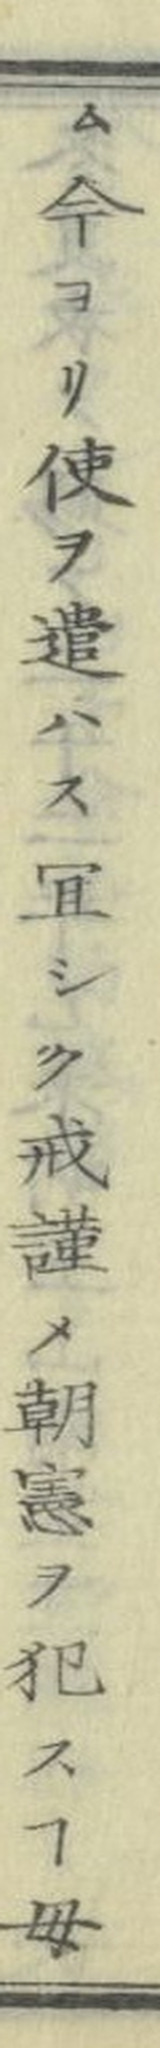ム今ヨリ使ヲ遣ハス冝シク戒謹シテ朝憲ヲ犯スコト母
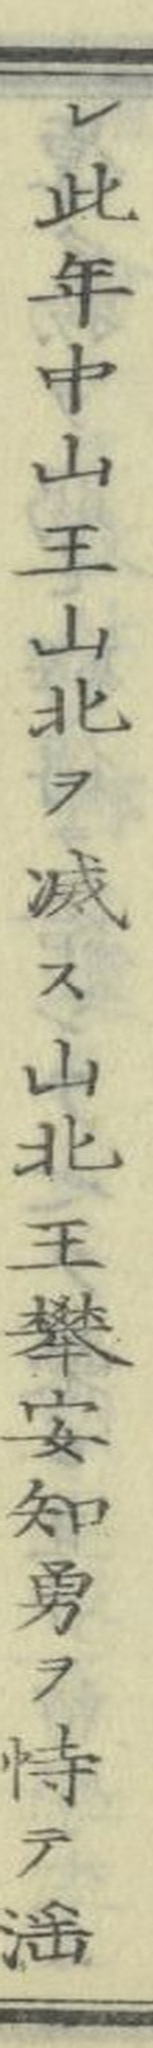レ此年中山王山北ヲ滅ス山北王攀安知勇ヲ恃テ
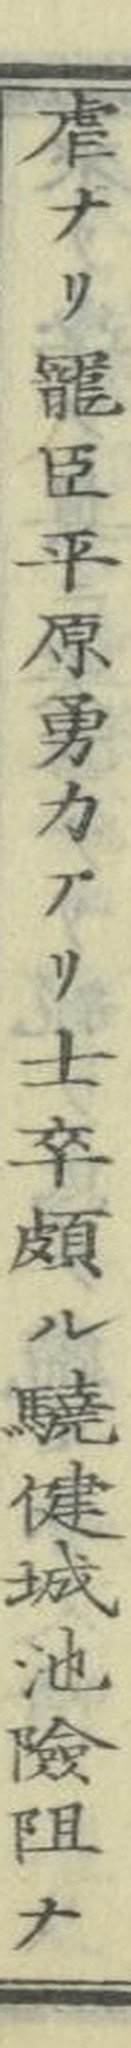虐ナリ罷臣平原勇力アリ士卒頗ル驍健城池險阻ナ
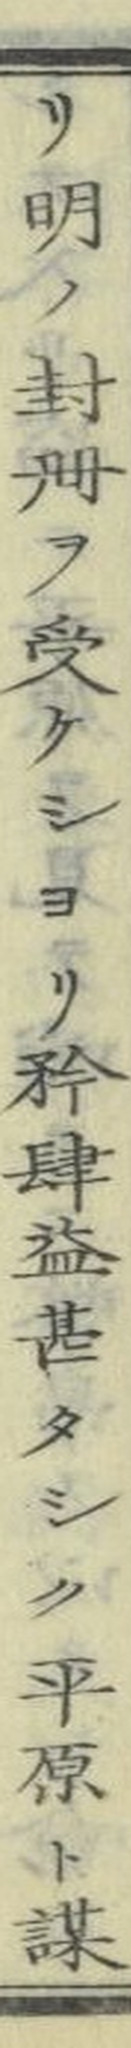リ明ノ封冊ヲ受ケシヨリ矜肆益甚タシク平原ト謀
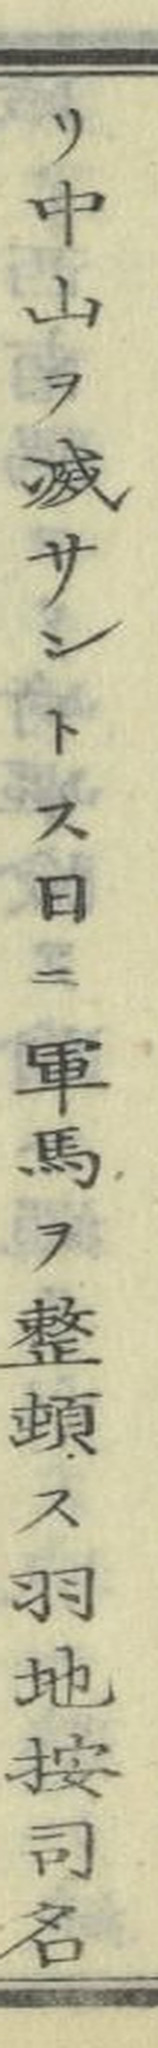リ中山ヲ滅サントス日ニ軍馬ヲ整頓ス羽地接按司名
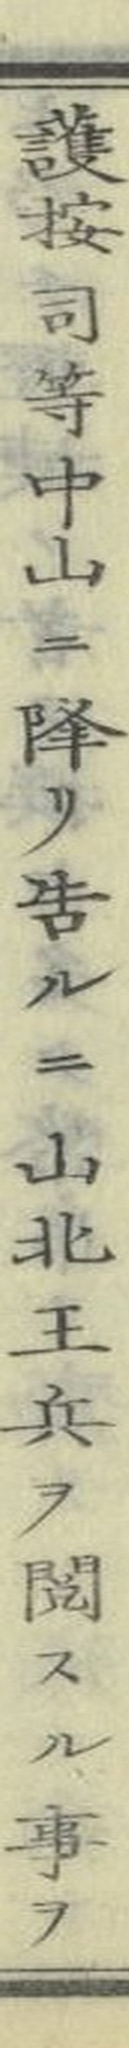護按司等中山ニ降リ告ルニ山北王兵ヲ閱スル事ヲ
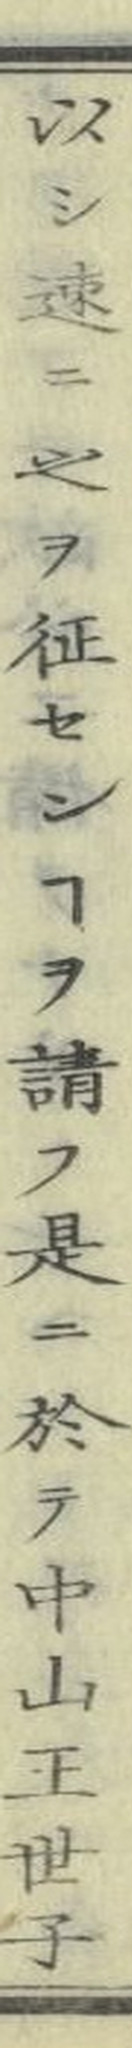以シ速ニ之ヲ征センコトヲ請フ是ニ於テ中山王世子
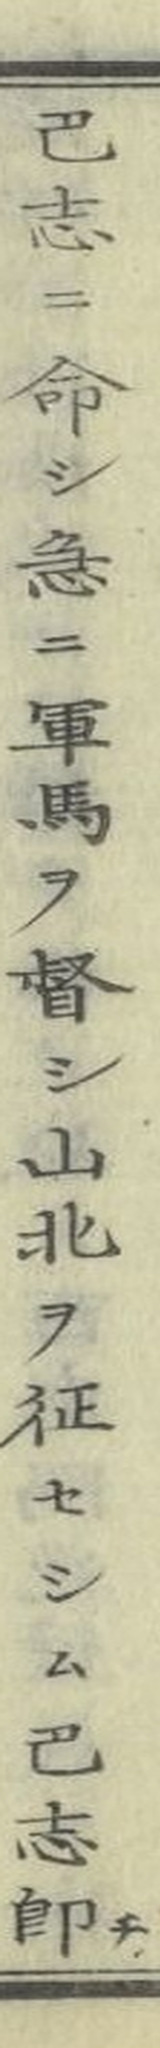巴志ニ命シ急ニ軍馬ヲ督シ山北ヲ征セシム巴志即
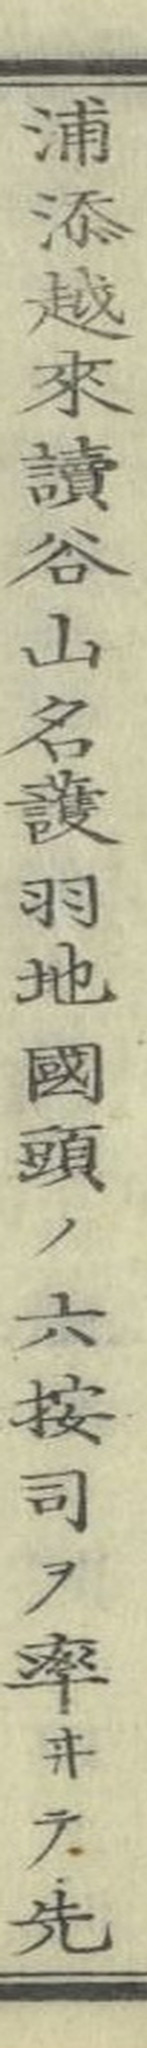浦添越來讀谷山名護羽地國頭ノ六按司ヲ率ヰテ先
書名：琉球藩史 一之巻
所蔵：University of the Ryukyus Library
